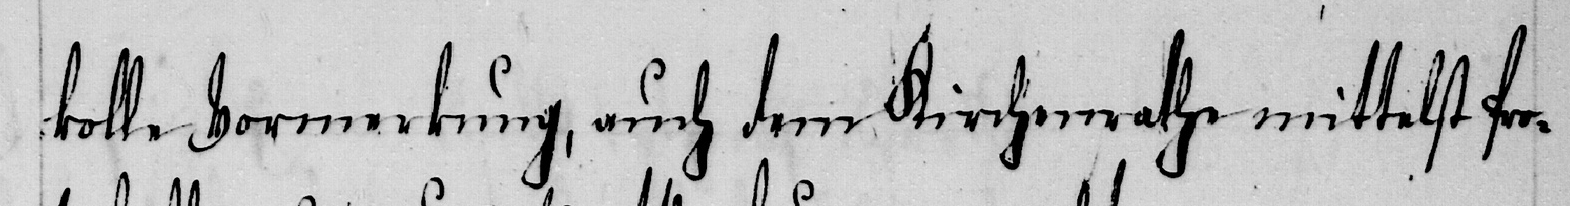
kolle Vormerkung, auch dem Kircherathe mittelst Pr¬
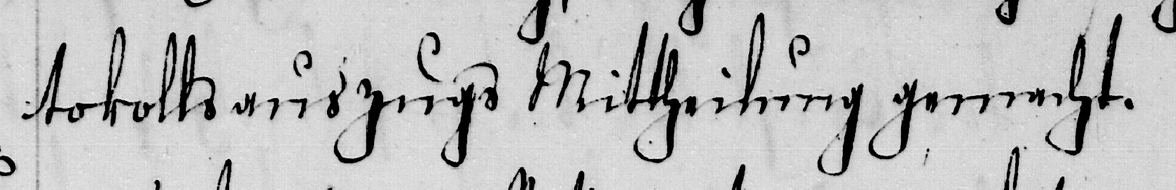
otokollsauszugs Mittheilung gemacht.
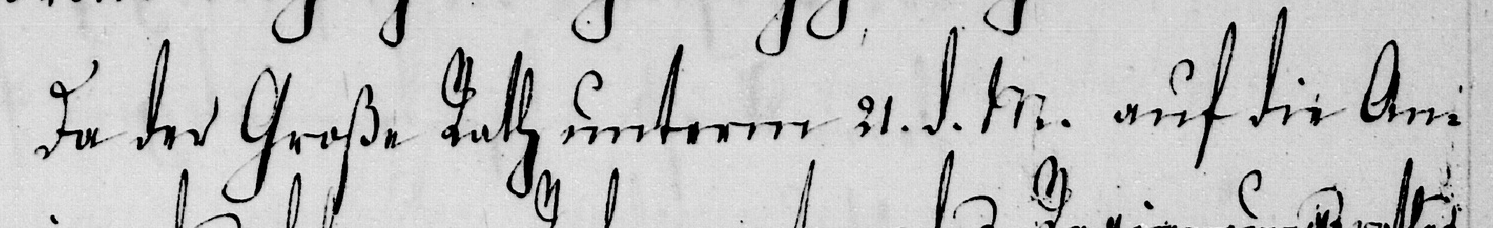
Da der Große Rath unterm 21. d. M. auf die An¬
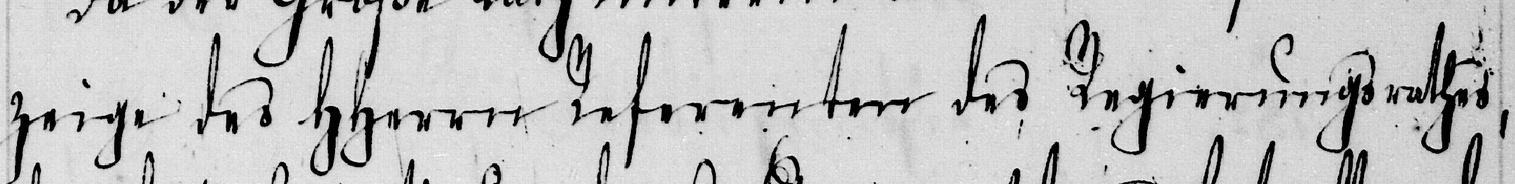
zeige des HHerrn Referenten des Regierungsrathes,
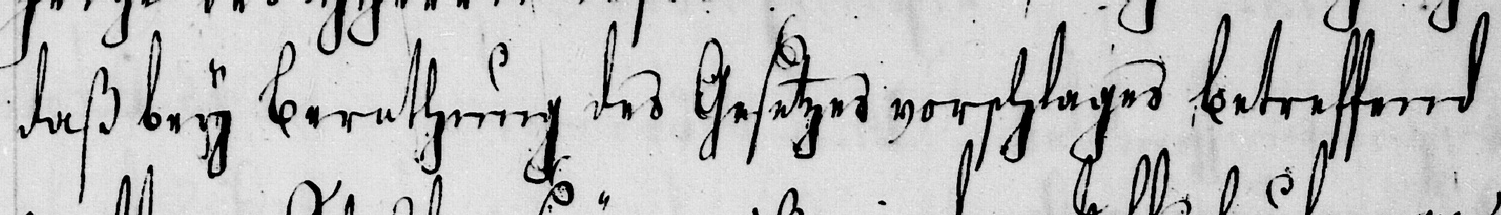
daß bey Berathung des Gesetzesvorschlages betreffend
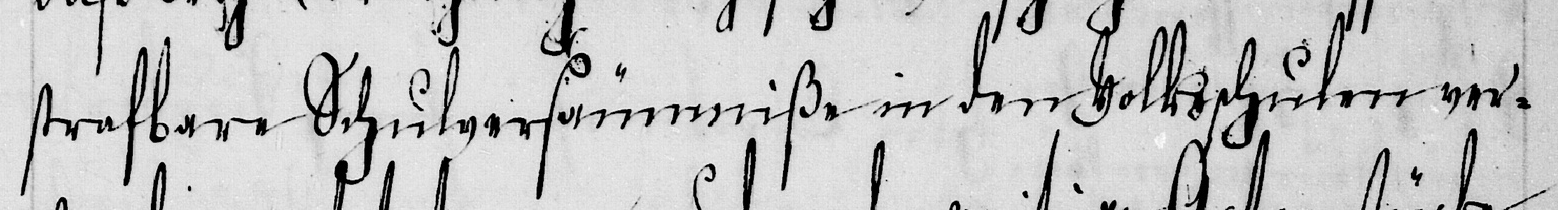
strafbare Schulversäumniße in den Volksschulen ver¬
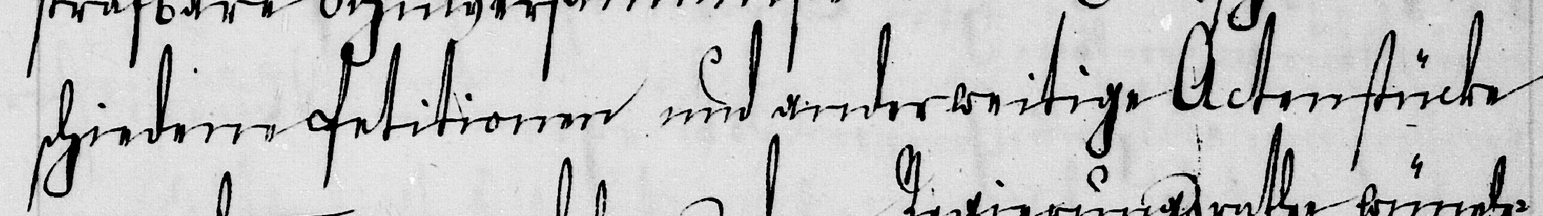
schiedene Petitionen und anderweitige Actenstücke
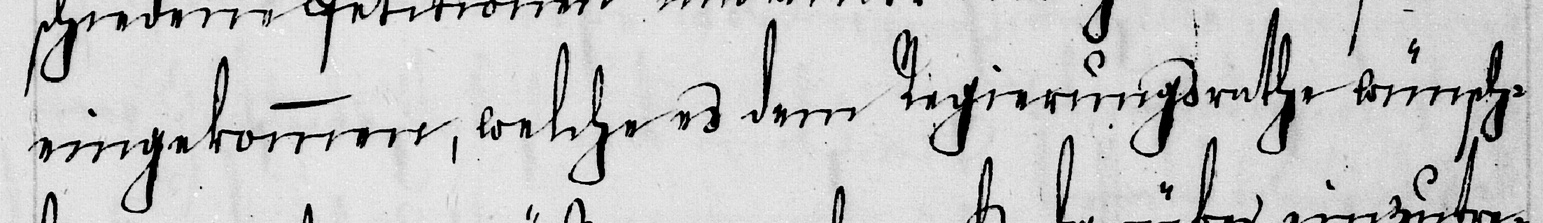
eingekommen, welche es dem Regierungsrathe wünsch¬
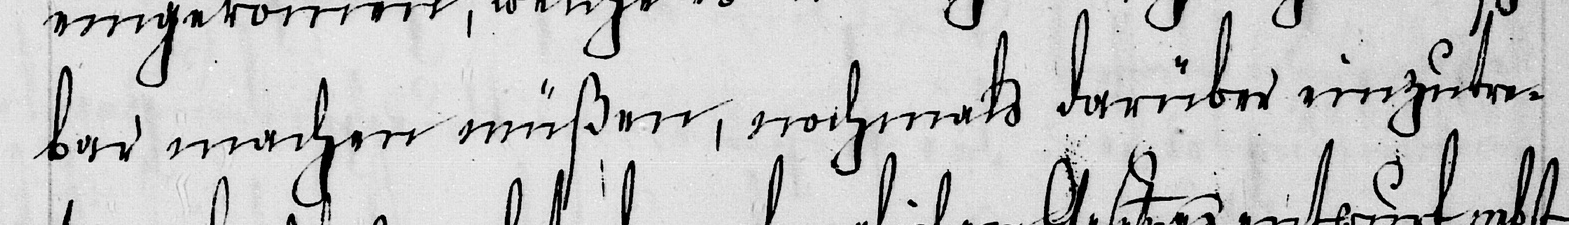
bar machen müßen, nochmals darüber einzutre¬
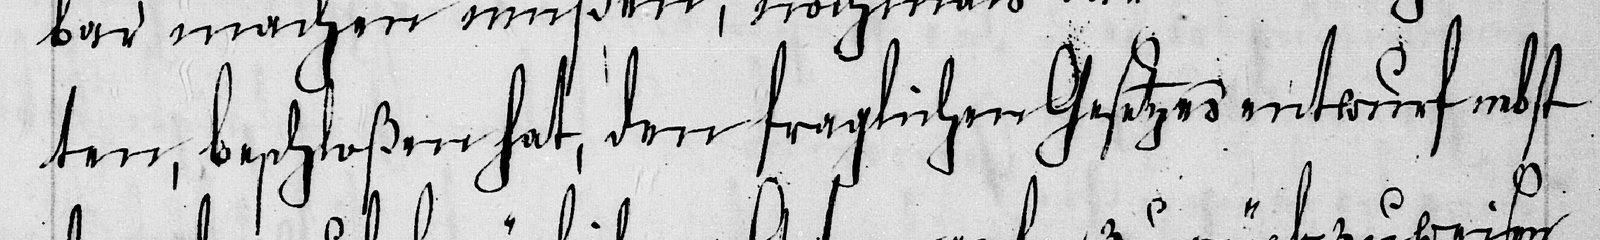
ten, beschloßen hat, den fraglichen Gesetzesentwurf nebst
